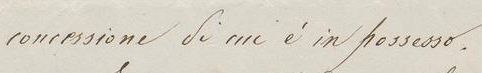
concessione di cui è in possesso.
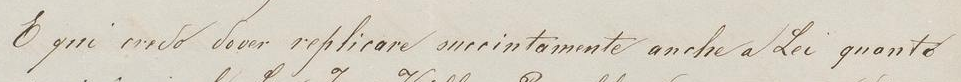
E qui credo dover replicare succintamente anche a Lei quanto
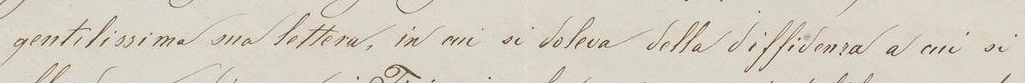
gentilissima sua lettera, in cui si doleva della diffidenza a cui si
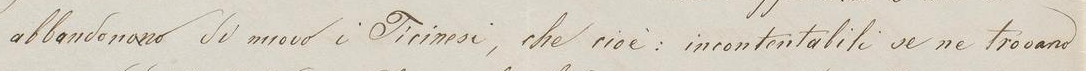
abbandonano di nuovo i Ticinesi, che cisè: incontentabili se ne trovano
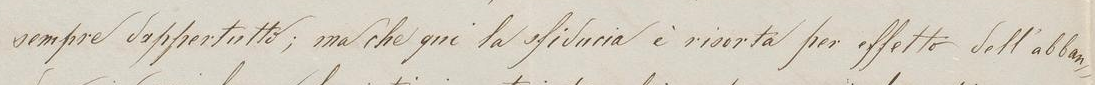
sempre dappertutto; ma che qui la sfiducia è risorta per effetto dell'abban-
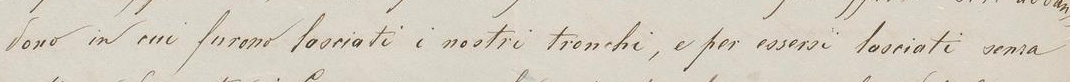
dono in cui furono lasciati i nostri tronchi, e per essersi lasciati senza
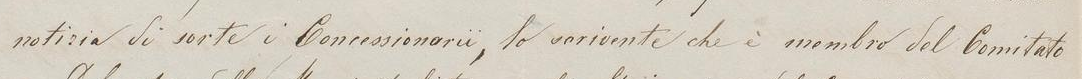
notizia di sorte i Concessionarii, lo scrivente che è membro del Comitato
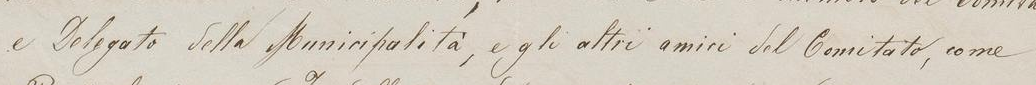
e Delegato della Municipalità, e gli altri amici del Comitato, come
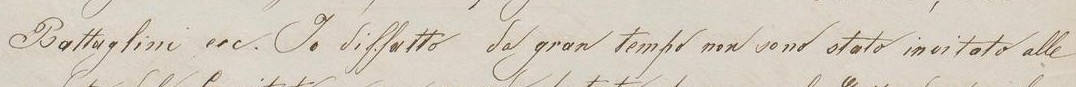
Battaglini ecc. Io diffatto da gran tempo non sono stato invitato alle
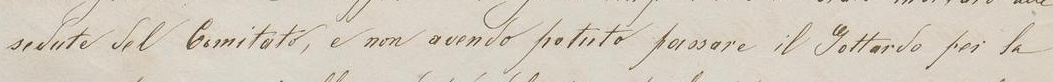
sedute del Comitato, e non avendo potuto passare il Gottardo per la
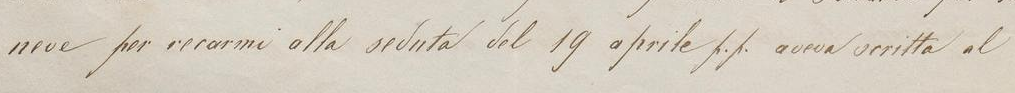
neve per recarmi alla seduta del 19 aprile p. p. aveva scritta al
